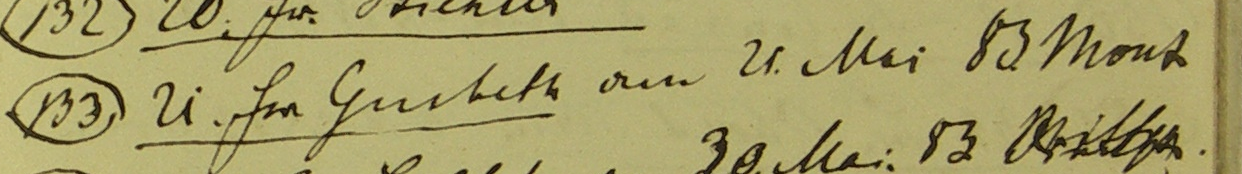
133. 21) Fr. Gusbeth am 21 .Mai 83 Montag
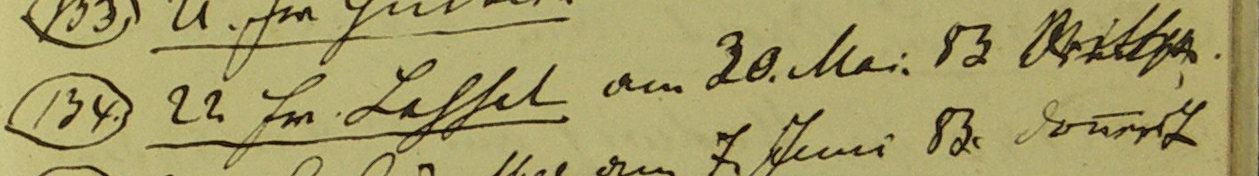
134. 22) Fr. Lassel am 30. Mai 83 Mittwoch
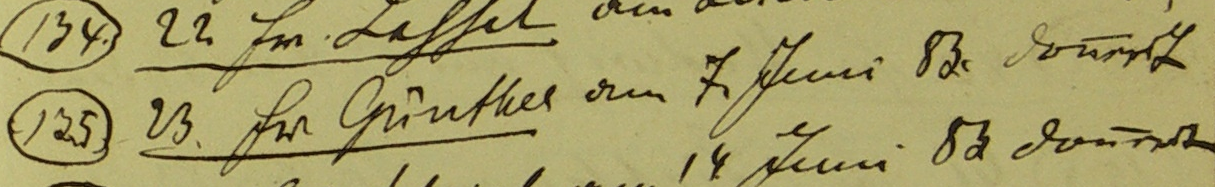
135. 23) Fr. Günther am 7. Juni 83 Donnerstag
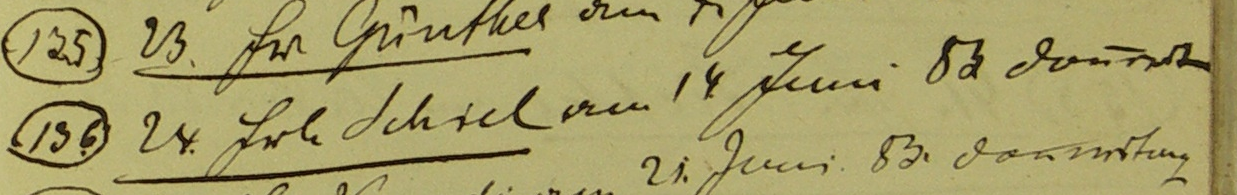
136. 24) Frl. Schiel am 14. Juni 83 Donnerstag
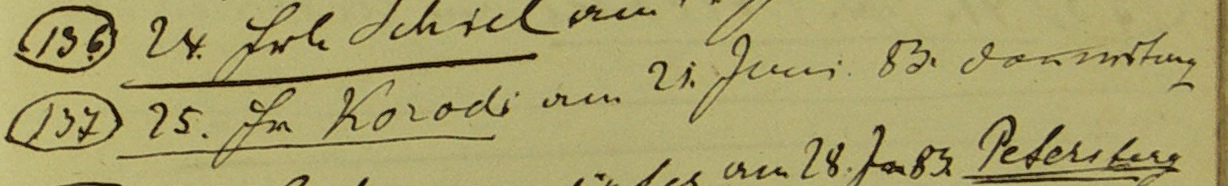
137. 25) Fr. Korodi am 21. Juni 83 Donnerstag
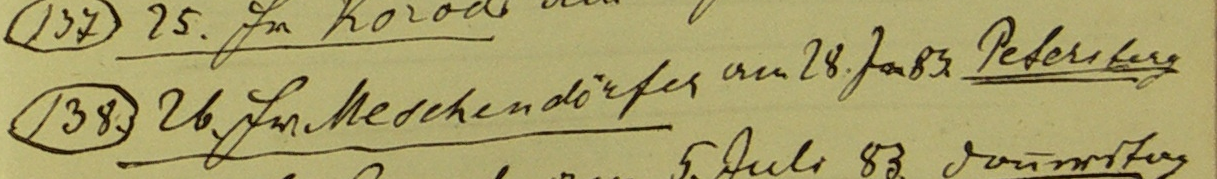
138. 26) Fr. Meschendörfer am 28. Juni 83 Peterstag
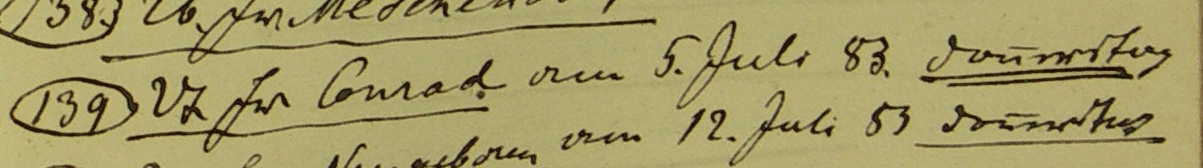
139. 27) Fr. Conrad am 5. Juli 83 Donnerstag
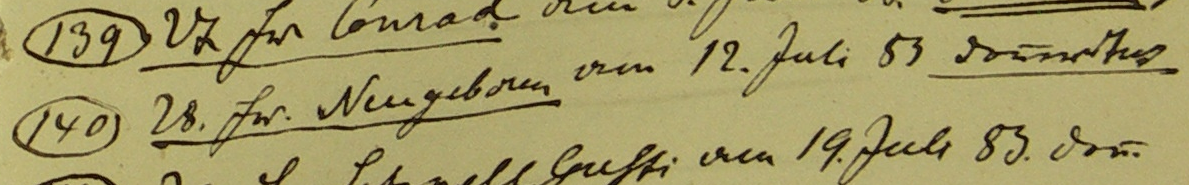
140. 28) Fr. Neugeboren am 12. Juli 83 Donnerstag
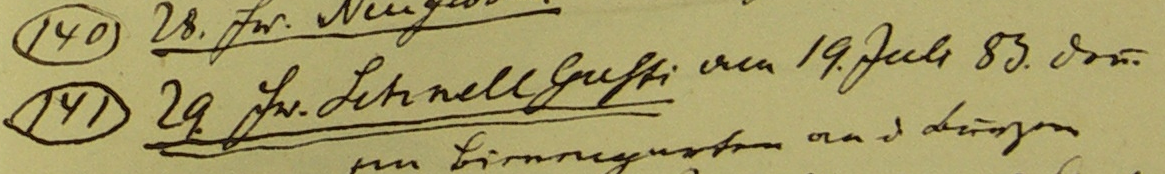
141. 29) Fr. Schnell Gusti am 19. Juli 83 Donnerstag
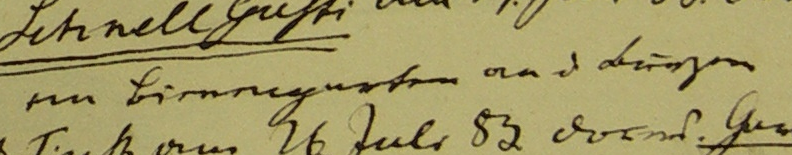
Im Birnengarten an der Burzen
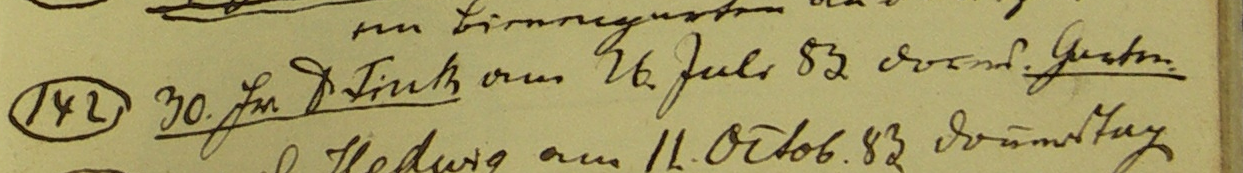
142. 30) Fr. Dr. Fink am 26. Juli 83 Donnerst. Garten
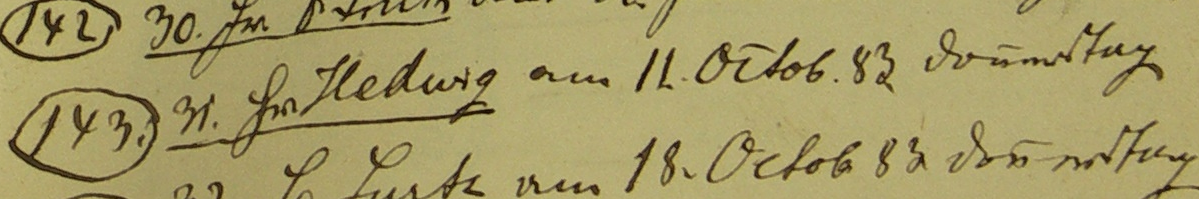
143. 31) Fr. Hedwig am 11. Oktob. 83 Donnerstag
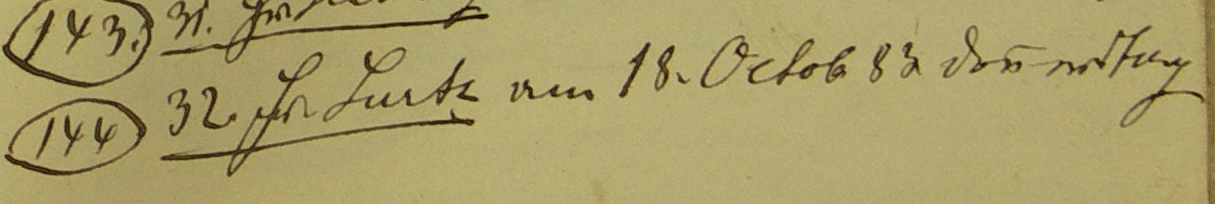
144. 32) Fr. Lurtz am 18. Oktob. 83 Donnerstag
